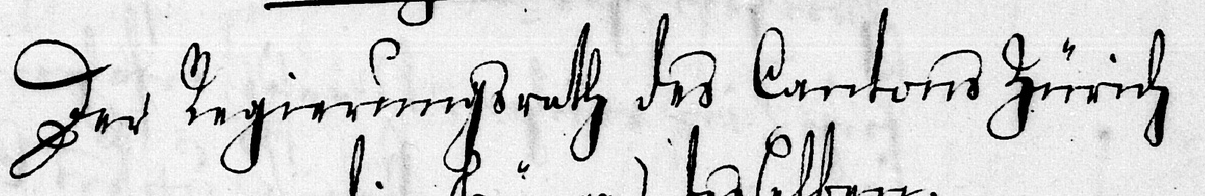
Der Regierungsrath des Cantons Zürich
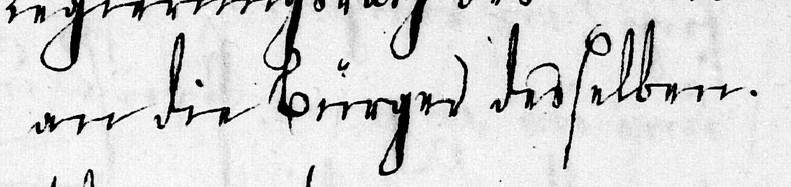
an die Bürger derselben.
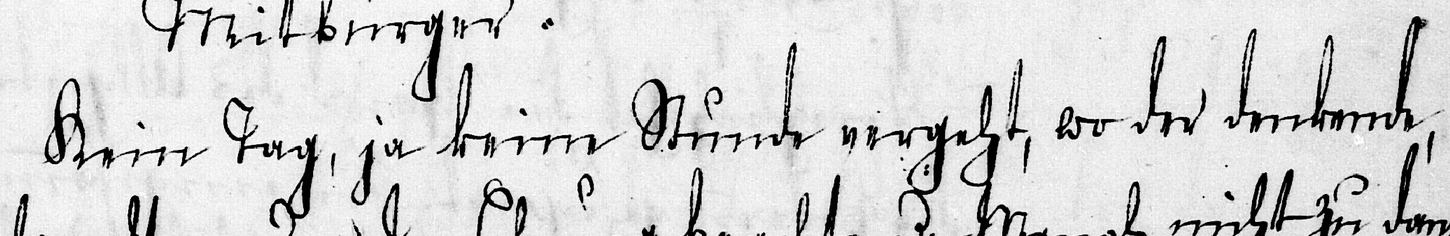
Kein Tag, ja keine Stunde vergeht, wo der denkende,
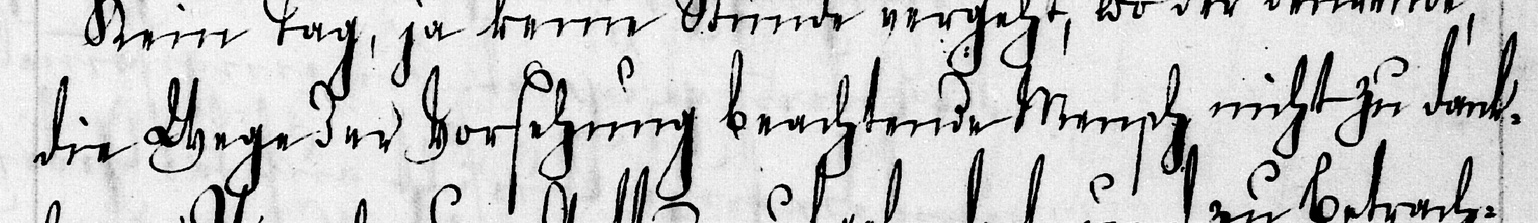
die Wege der Vorsehung beachtende Mensch nicht zu dank¬
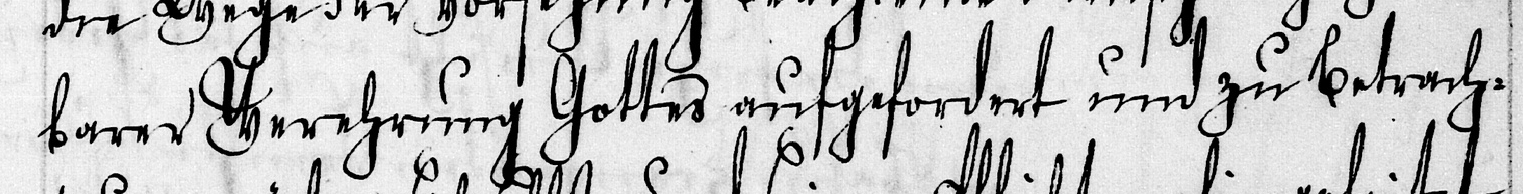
barer Verehrung Gottes aufgefordert und zu Betrach¬
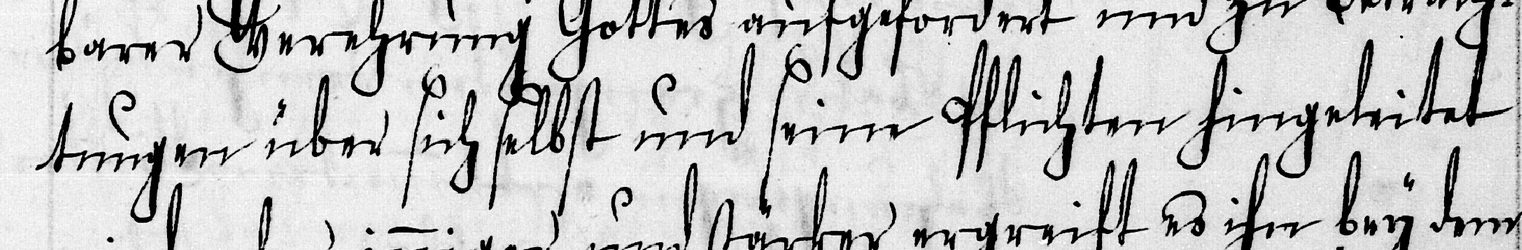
tungen über sich selbst und seine Pflichten hingeleitet
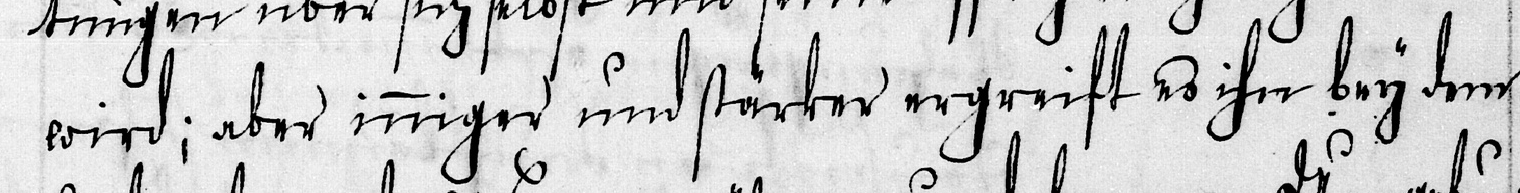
wird; aber inniger und stärker ergreift es ihn bey dem
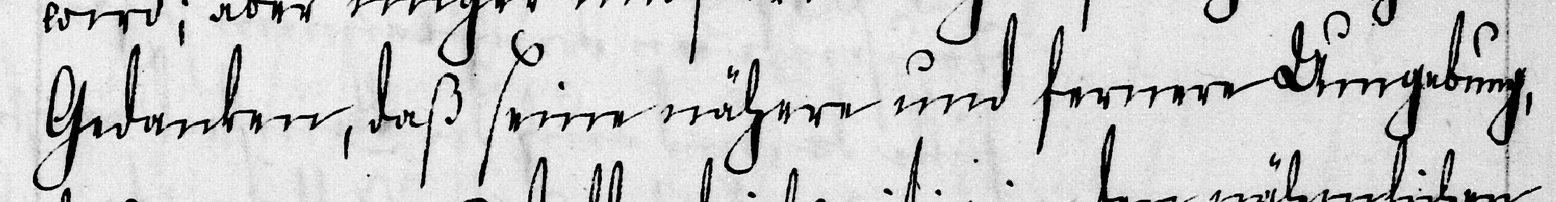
Gedanken, daß seine nähere und fernere Umgebung,
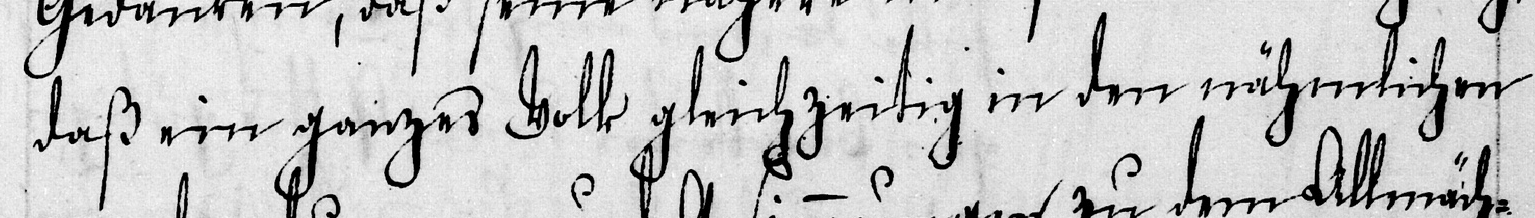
daß ein ganzes Volk gleichzeitig in den nähmlichen
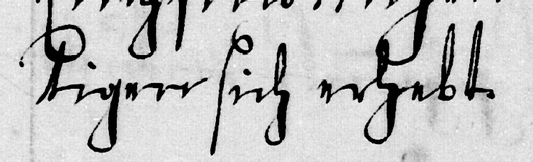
tigen sich erhebt.
